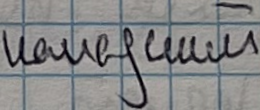канадский
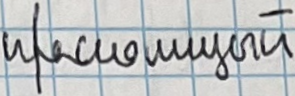краснолицый
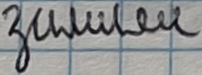зимняк
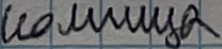колпица
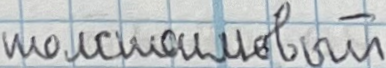толстоклювый
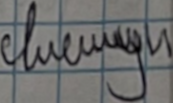свистун
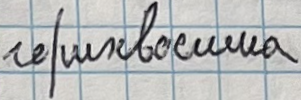горихвостка
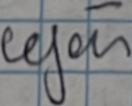седой
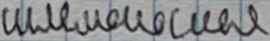шлемоносная
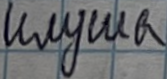клуша
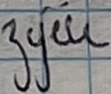зуёк
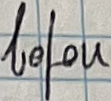ворон
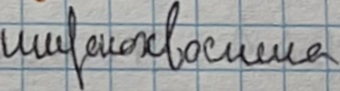широкохвостка
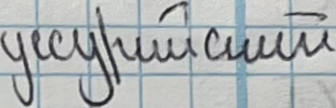уссурийский
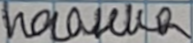поганка
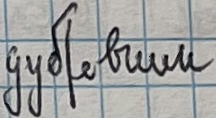дубровник
